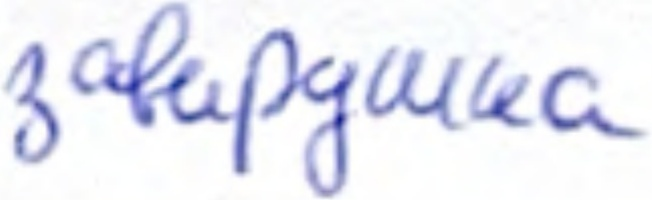завирушка
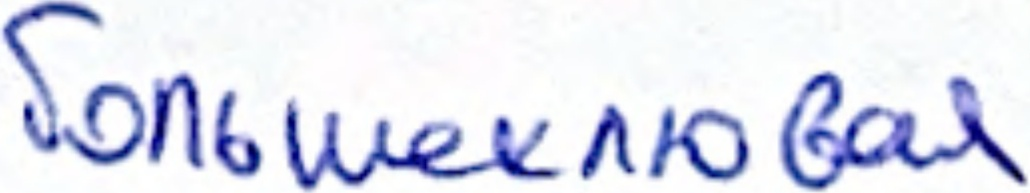большеклювая
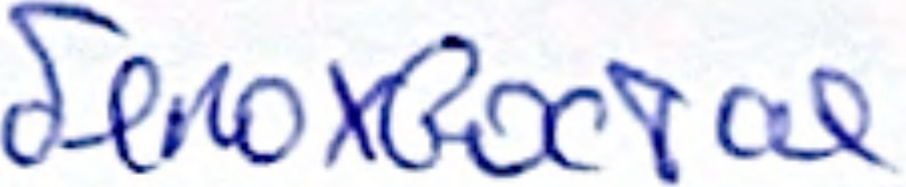белохвостая
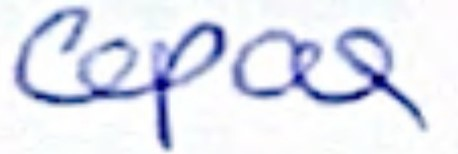серая
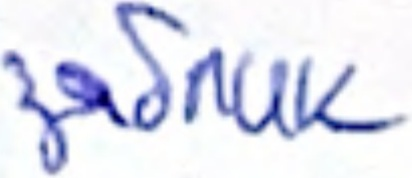зяблик
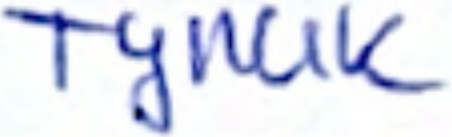тупик
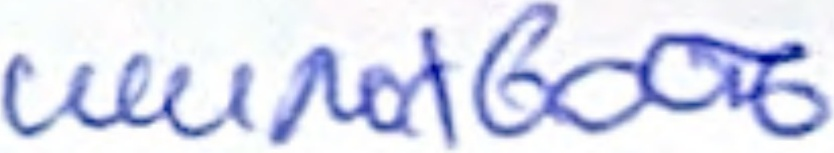шилохвость
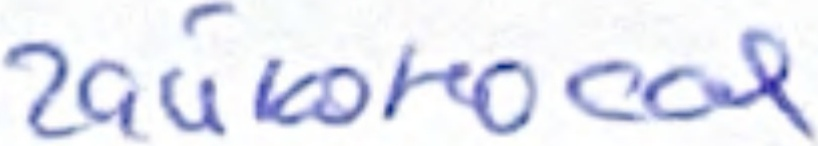чайконосая
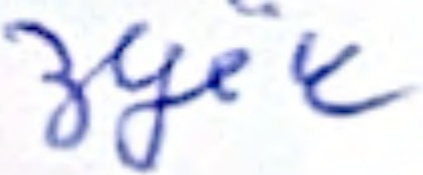зуёк
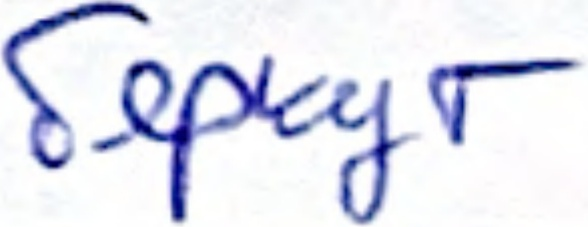беркут
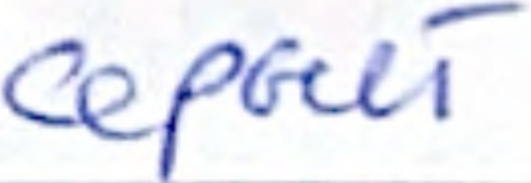серый
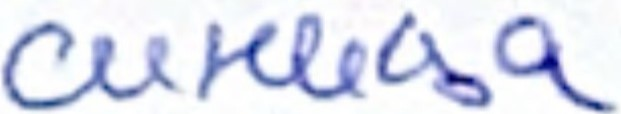синица
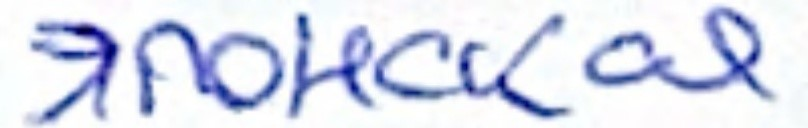японская
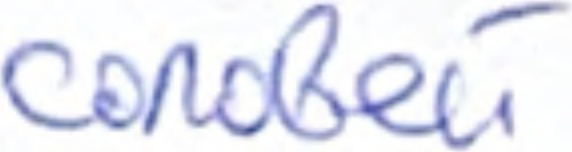соловей
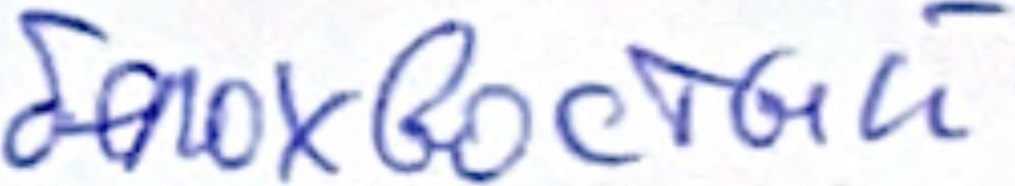белохвостый
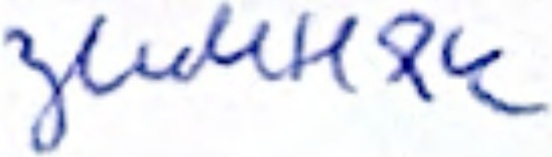зимняк
